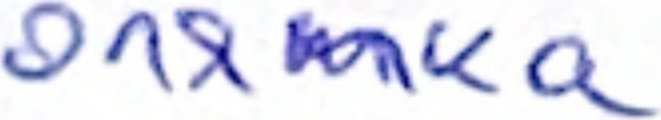оляпка
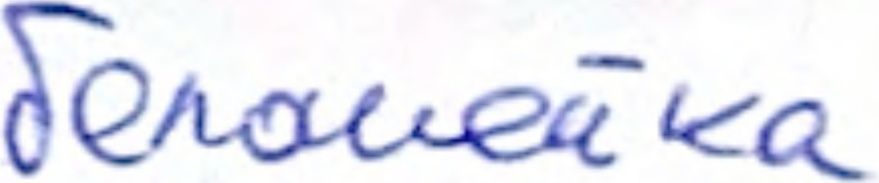белошейка
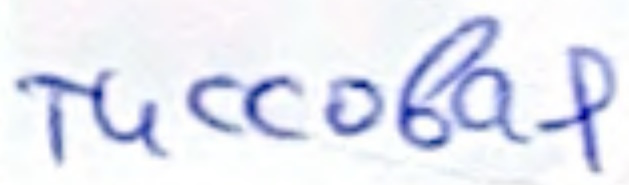тиссовая
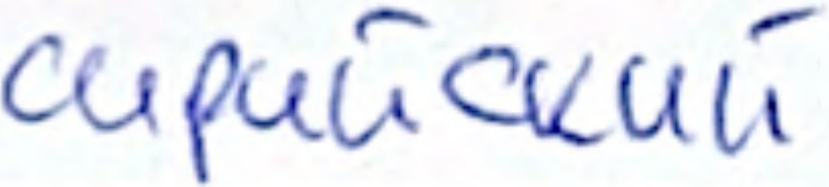сирийский
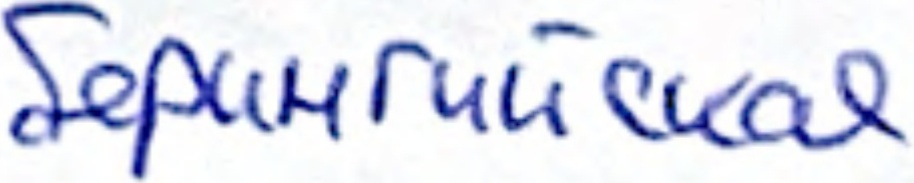берингийская
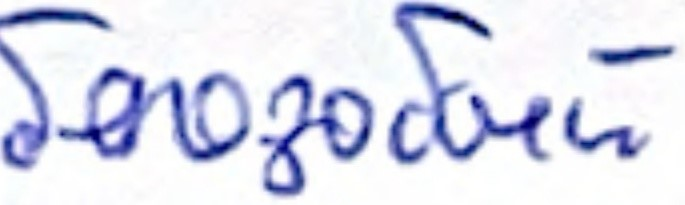белозобый
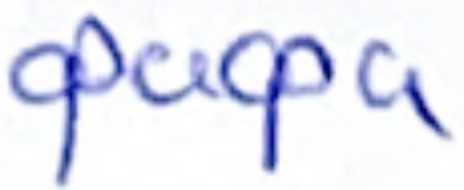фифи
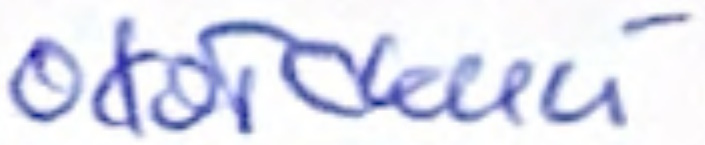охотский
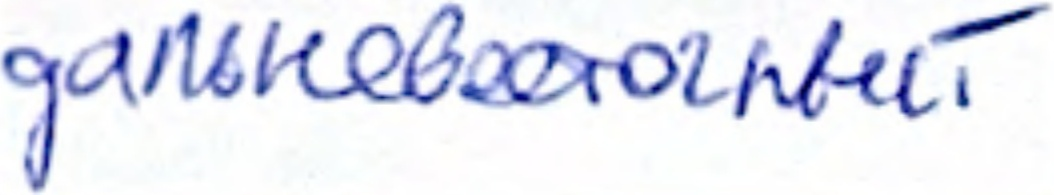дальневосточный
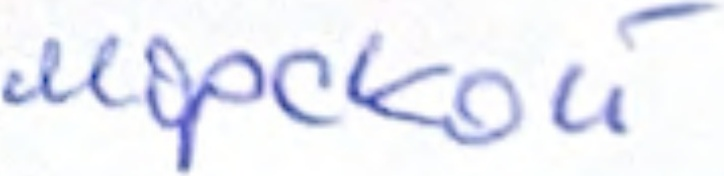морской
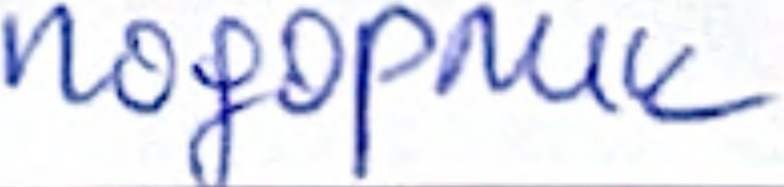подорлик
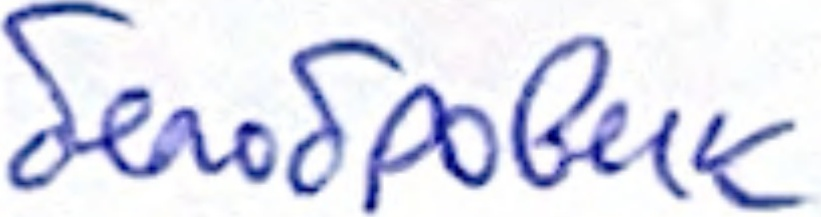белобровик
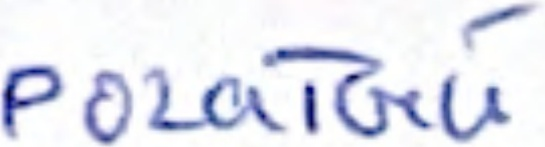рогатый
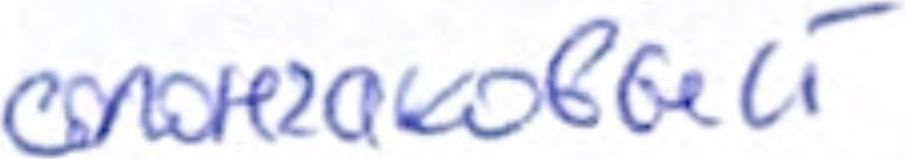солончаковый
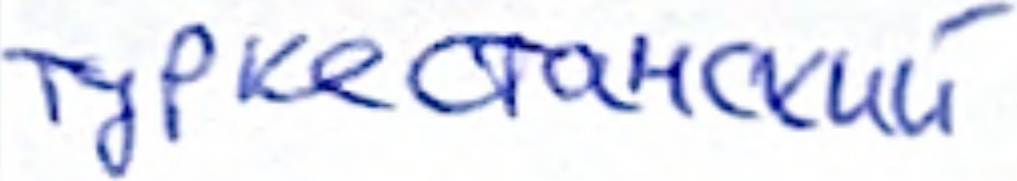туркестанский
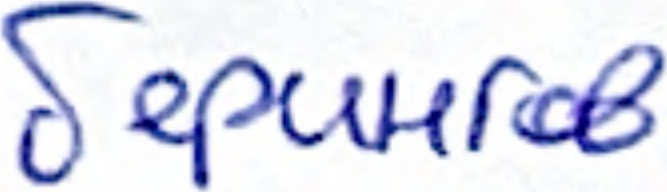берингов
